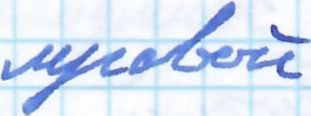луговой
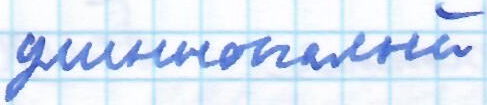длиннопалый
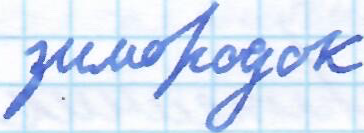зимородок
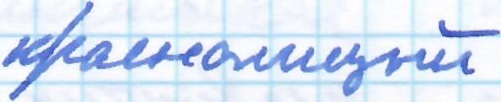краснолицый
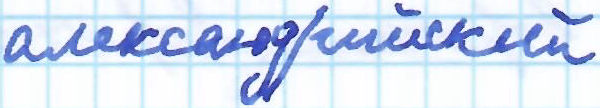александрийский
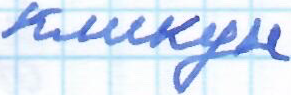кликун
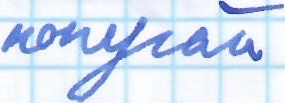попугай
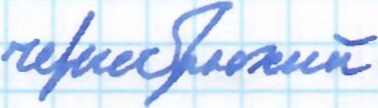чернобрюхий
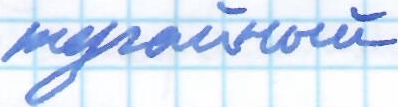тугайный
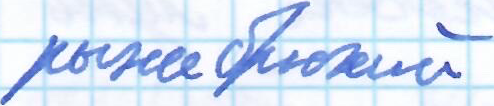рыжебрюхий
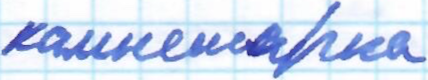камнешарка
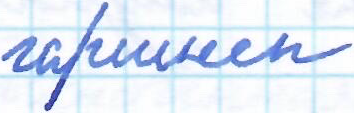гаршнеп
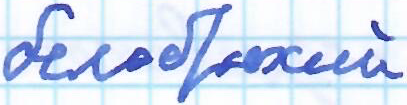белобрюхий
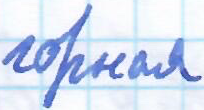горная
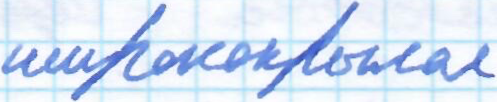ширококрылая
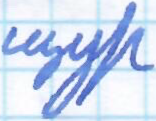щур
